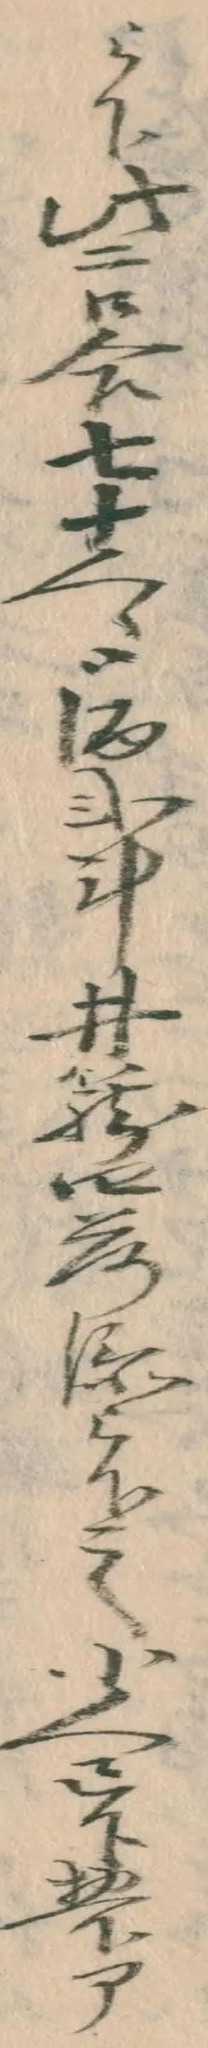被下此二口合七十人へ御酒弐斗井籠四荷添被下之小人已下惣下戸
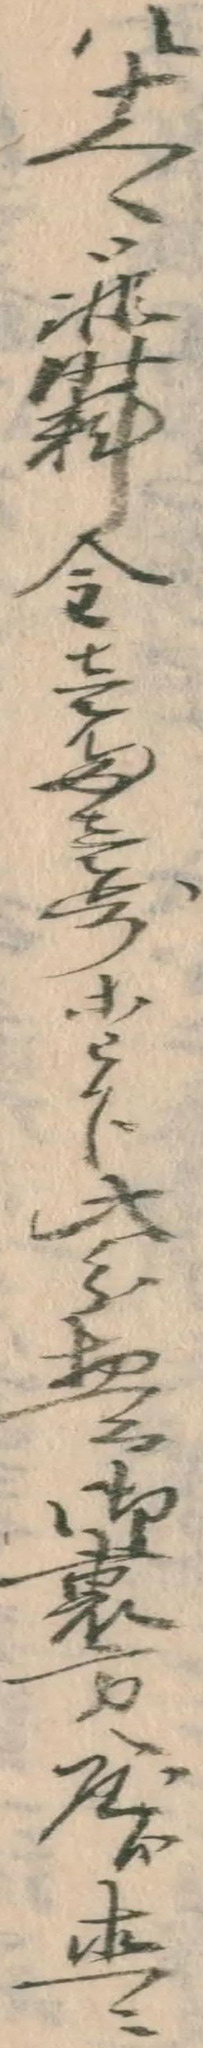八十人へ御非時料金壱両三歩等被下此分惣而御裏方へ屋ゟ直に
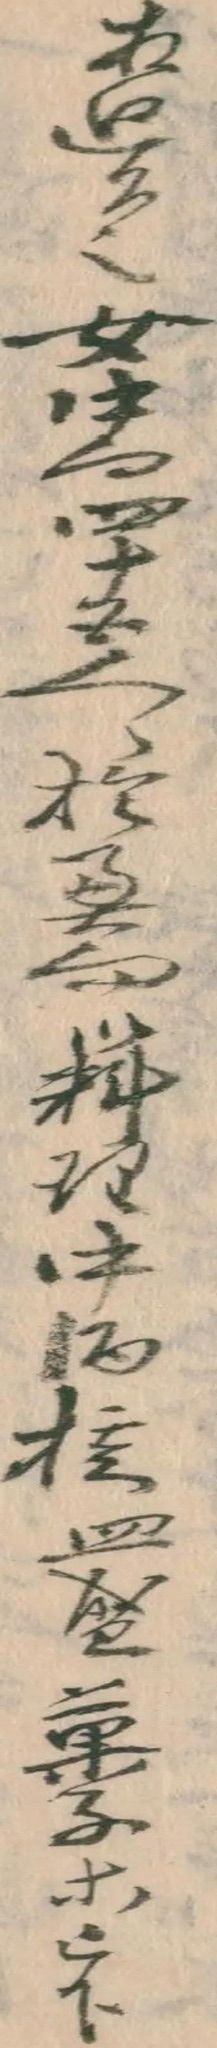相廻候也女中向四十五人へ於奥向御料理中酒核皿盛菓子等已下
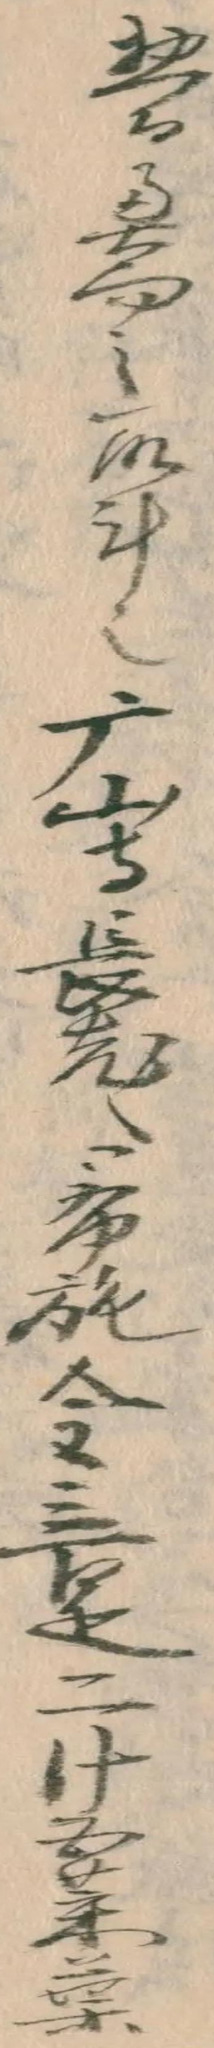惣而奥向之取斗也摩山寺長老へ御布施金三百疋二汁五菜菓
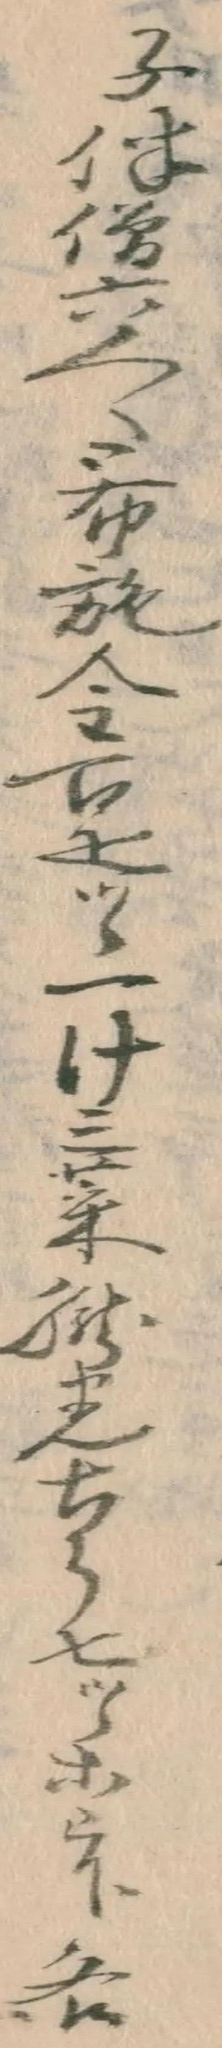子伴僧六人へ御布施金百疋ツヽ一汁三菜朧まんちう七ツゝ等被下各
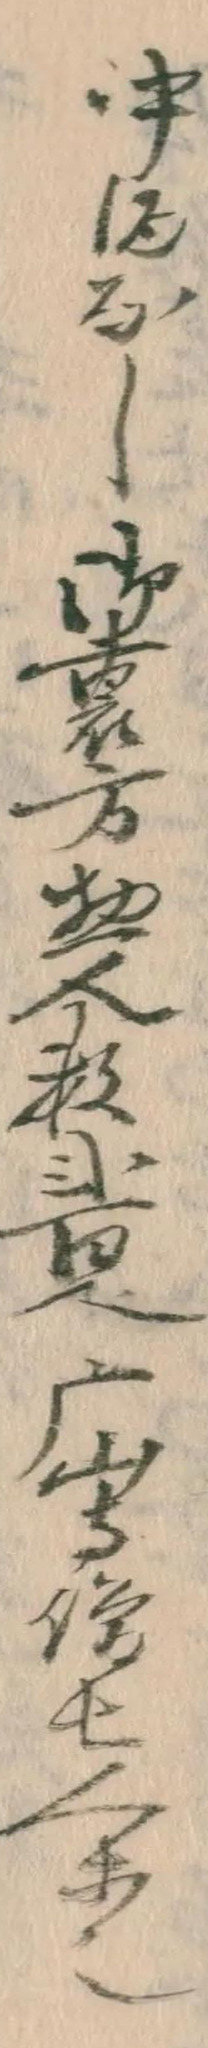中酒なし御裏方惣人数弐百人摩山寺僧七人等也
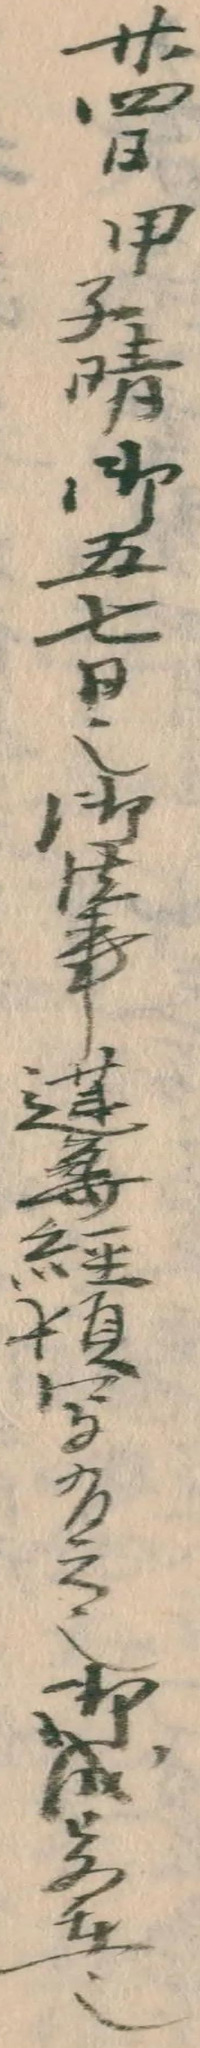廿四日甲子晴御五七日之御法事蓮華経頓写有之也御成被為在也
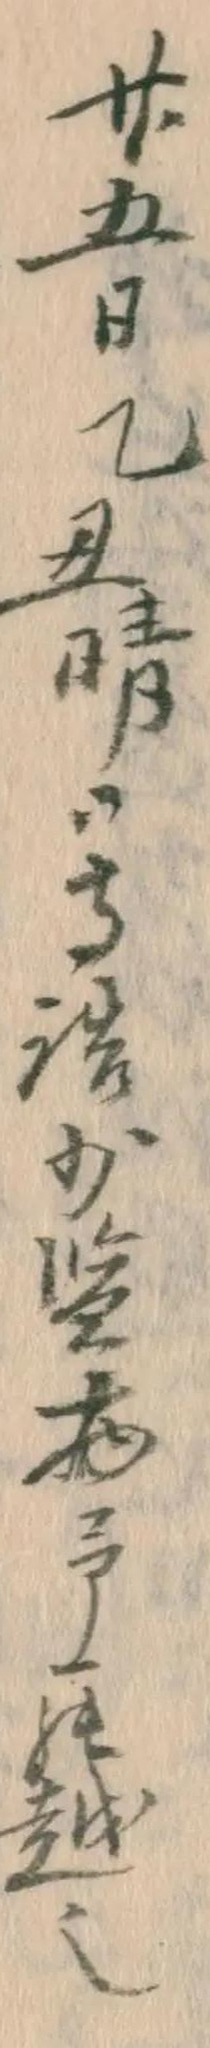廿五日乙丑晴御寺詰少監物予罷越也
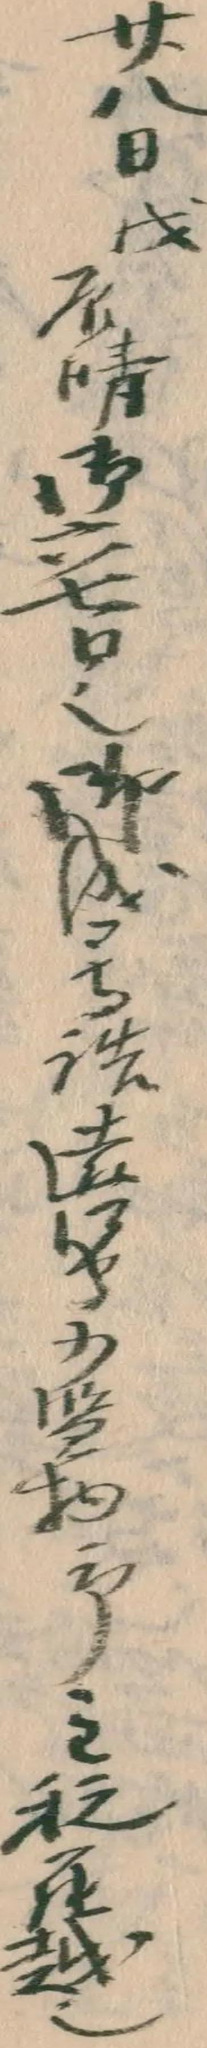廿八日戊辰晴御六七日也御寺詰遠江守小監物予主税罷越也
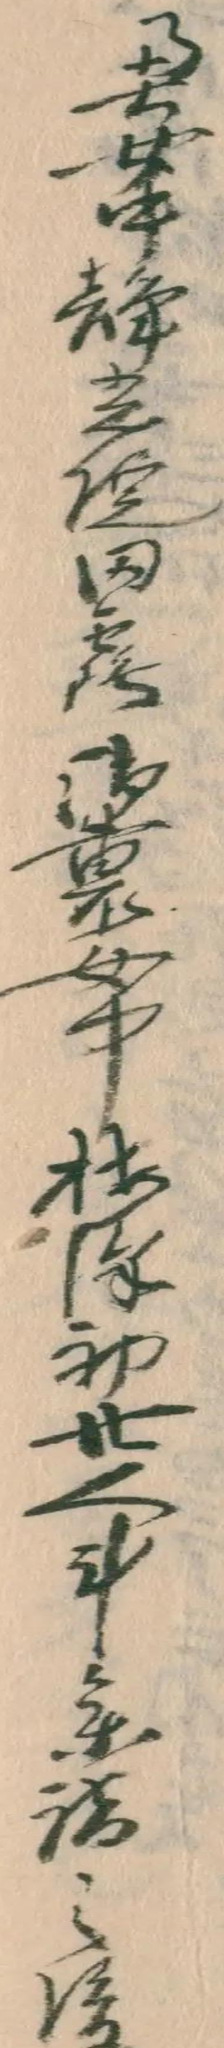奥女中静光院田露御裏女中梅添初廿人斗参詣之後
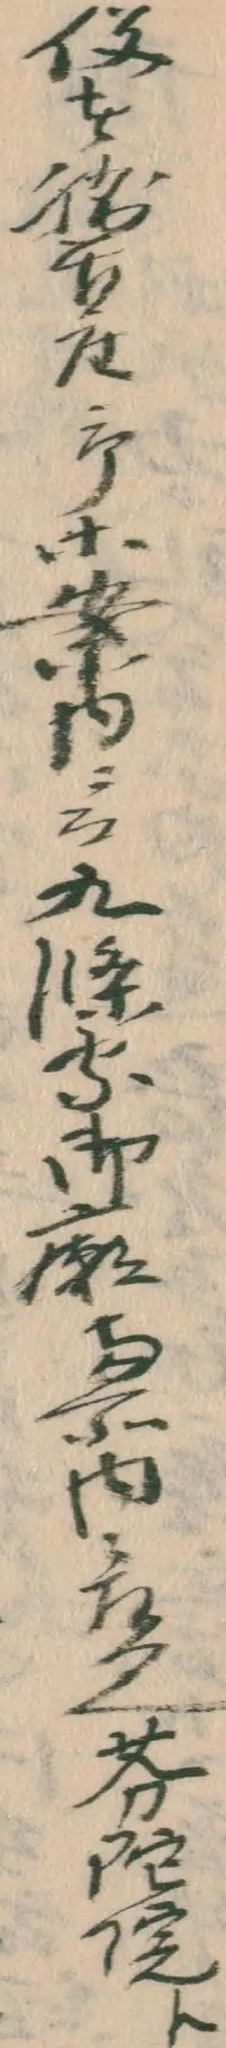役は座予等案内ニ而九條家御廟両所内々拝見芬陀院え
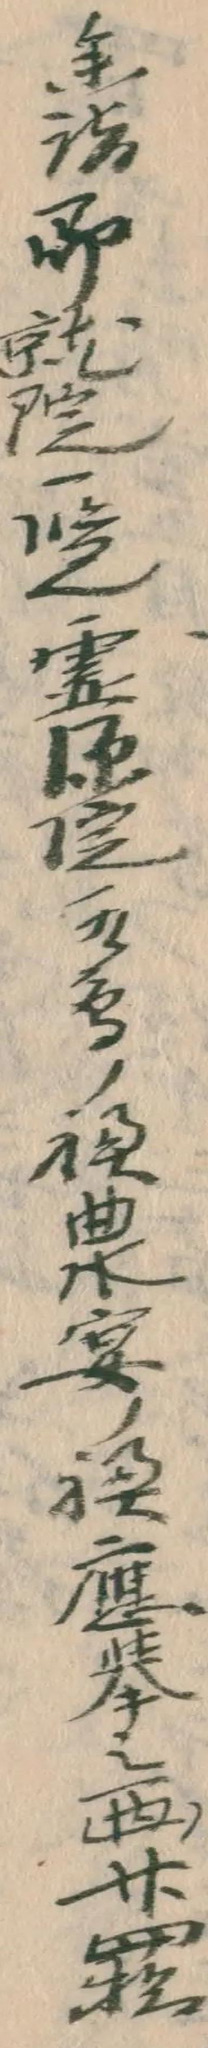参詣即就院一覧霊源院水鳥ノ襖曲水宴ノ襖應挙之画廿四枚
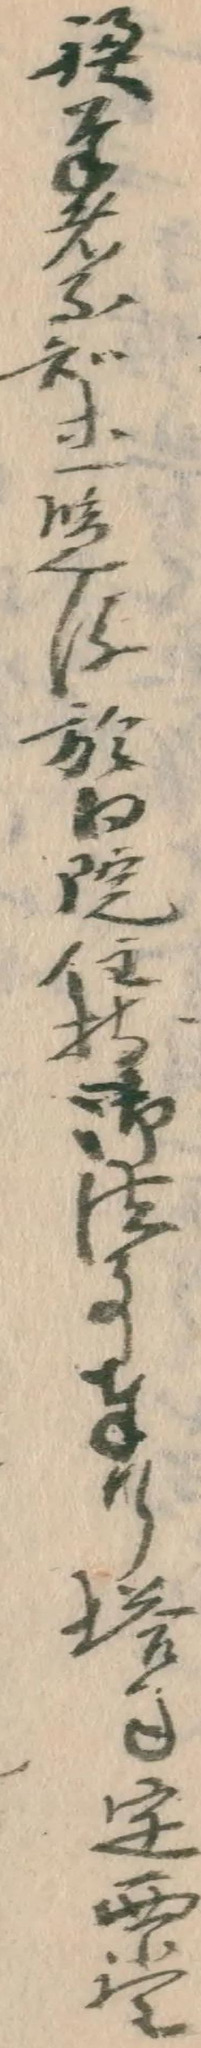襖物不知等一覧後於同院住持御法事奉行塔司定西小野
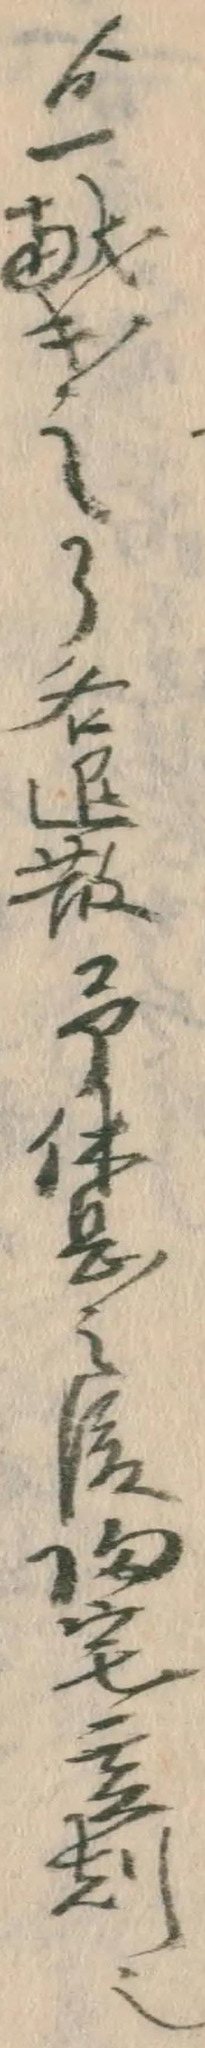ゟ一献出之了各退散予休息之後帰宅亥刻也
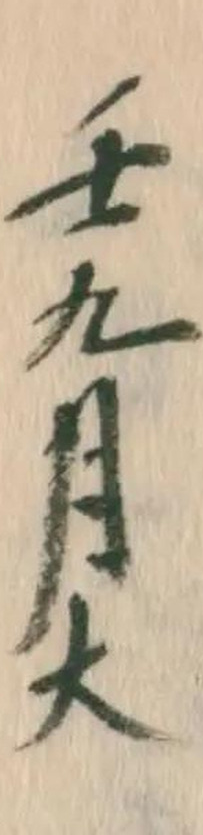壬九月大
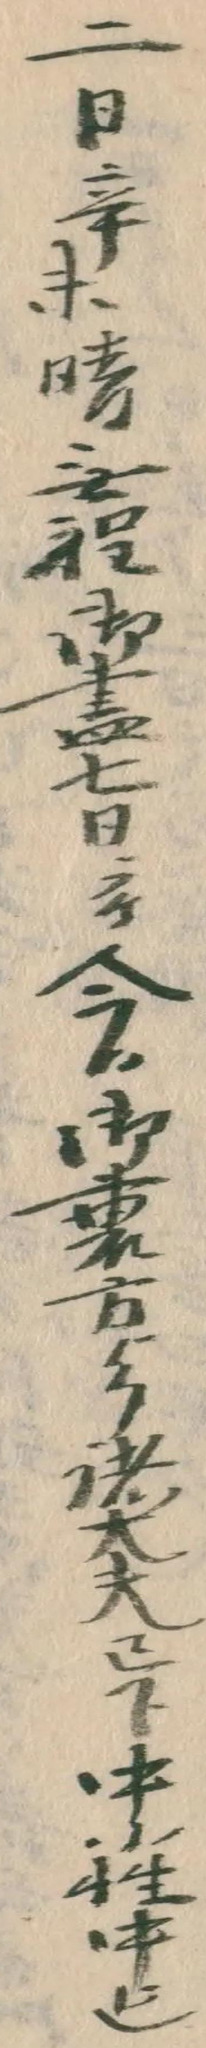二日辛未晴無程御盡七日二而今日御裏方より諸大夫已下中小性中迄
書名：賀茂社記録. 第69冊
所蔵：国立国会図書館 National Diet Library, JAPAN
